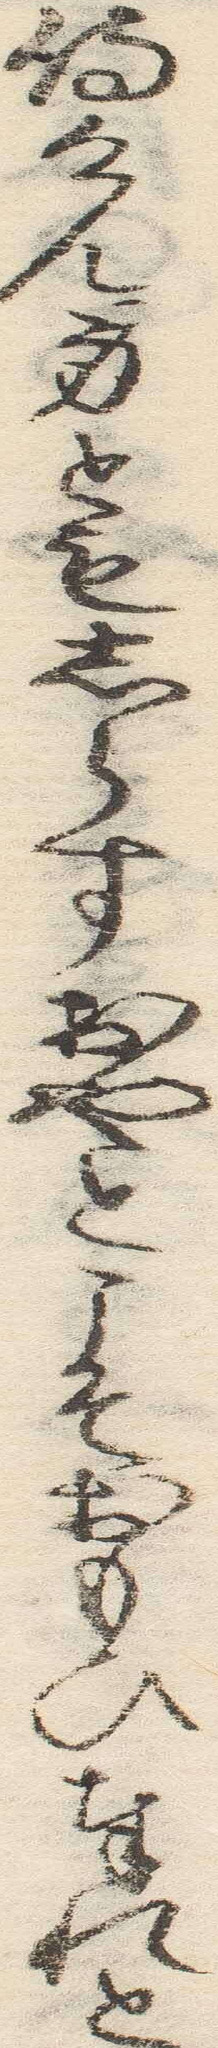侍けん身ともしらすおやとこそおもひ奉れと
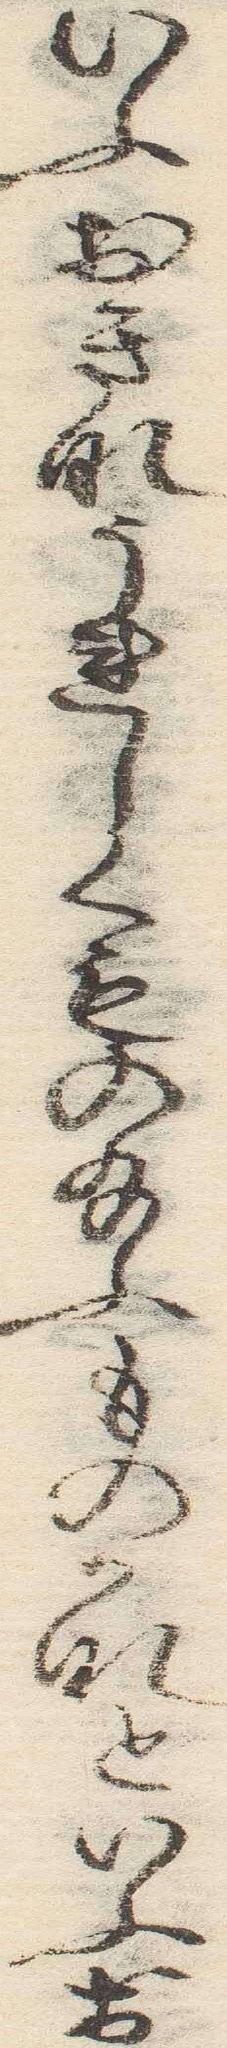いふおきなうれしくもの給ふものかなといふお
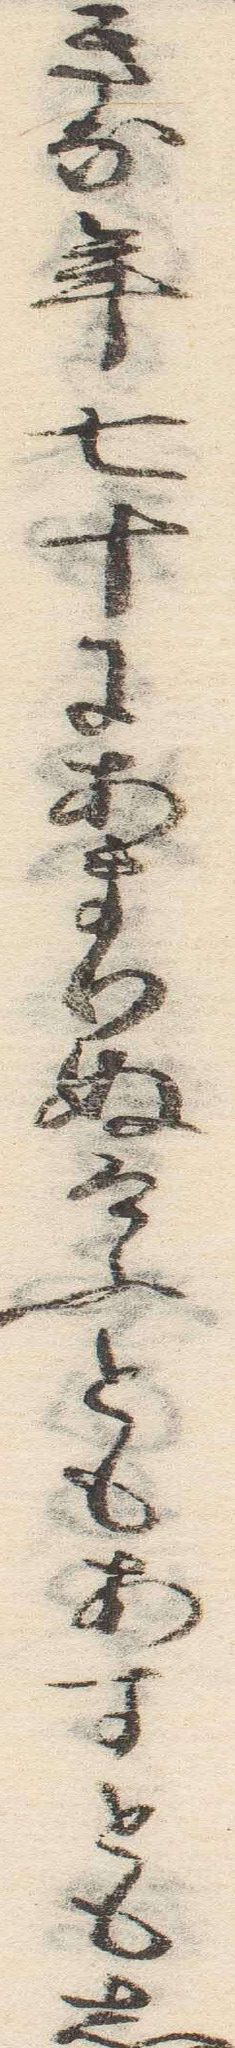きな年七十にあまりぬけふともあすともし
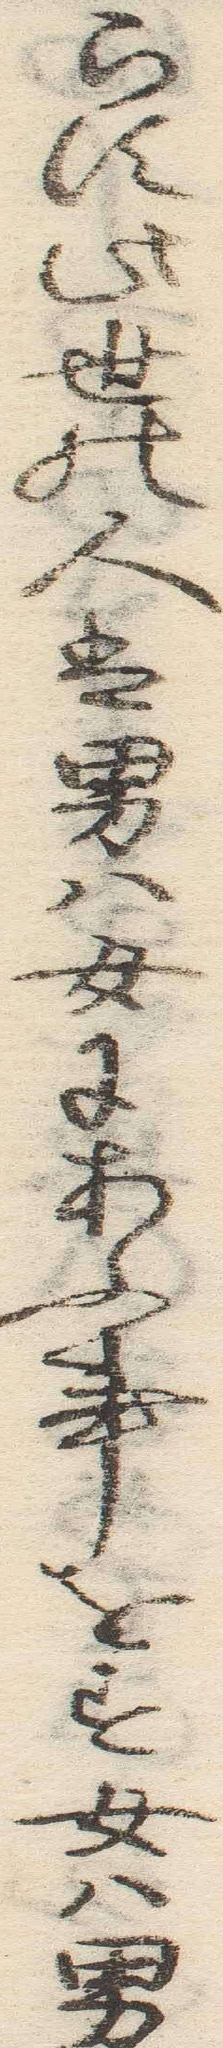らす此世の人は男は女にあふ事をす女は男
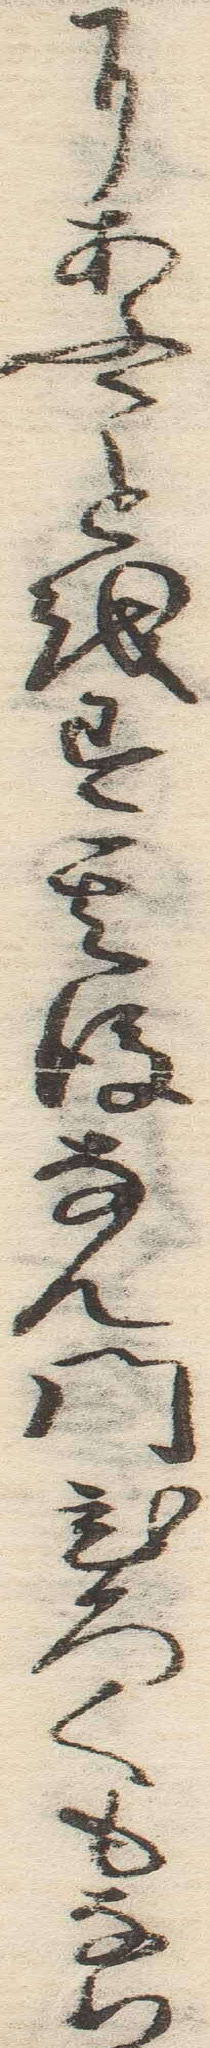にあふことをす其後なん門ひろくもなり
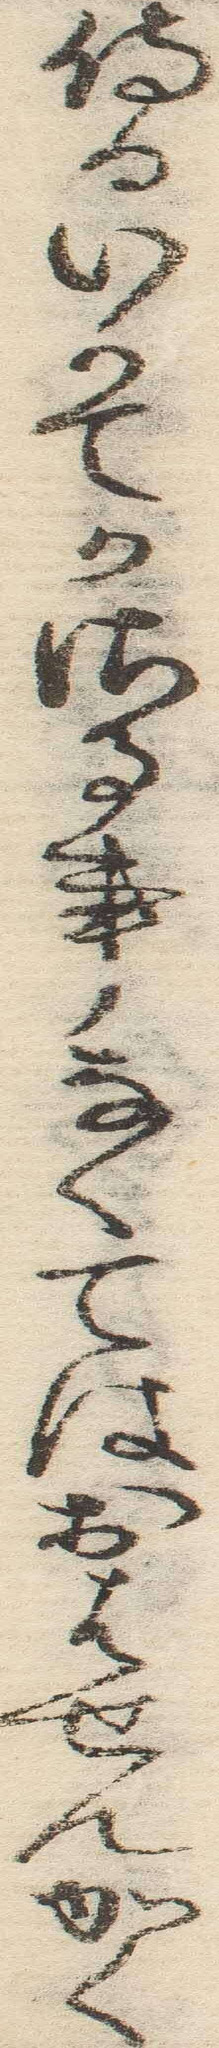侍るいかてかさる事なくてはおはせんかく
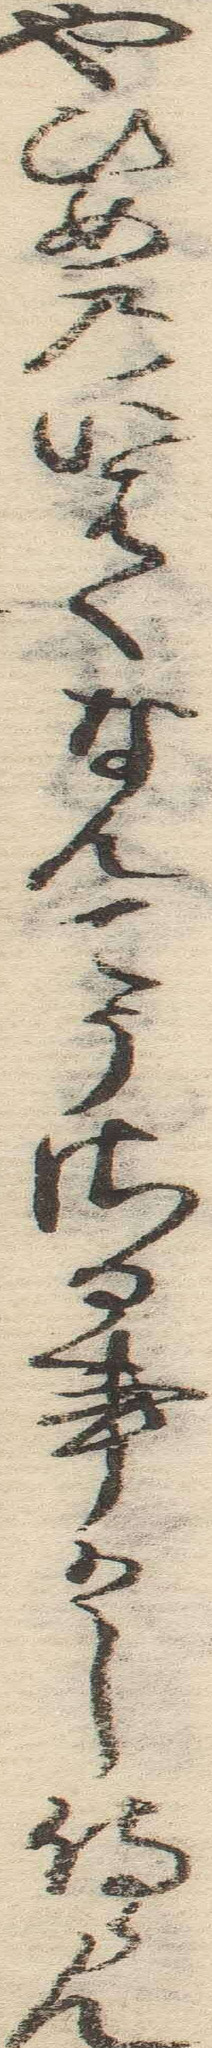やひめのいはくなんてうさる事かし侍らん

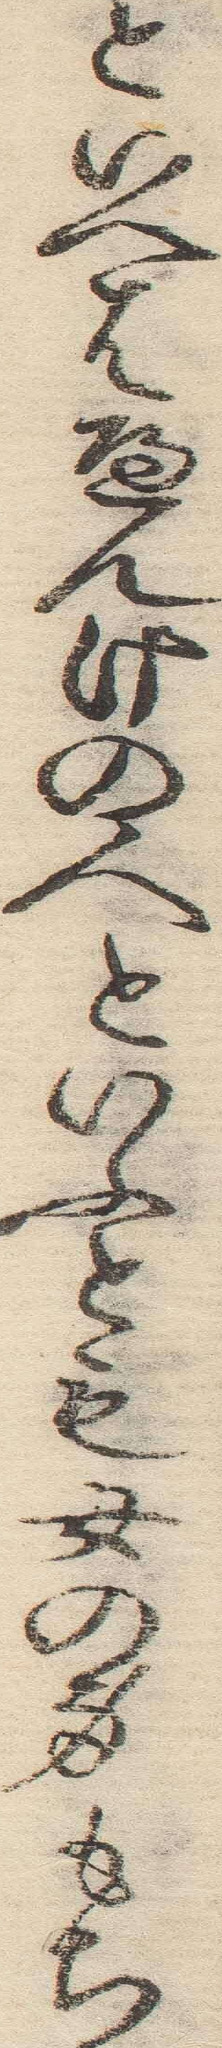といへはへんけの人といふとも女の身もち
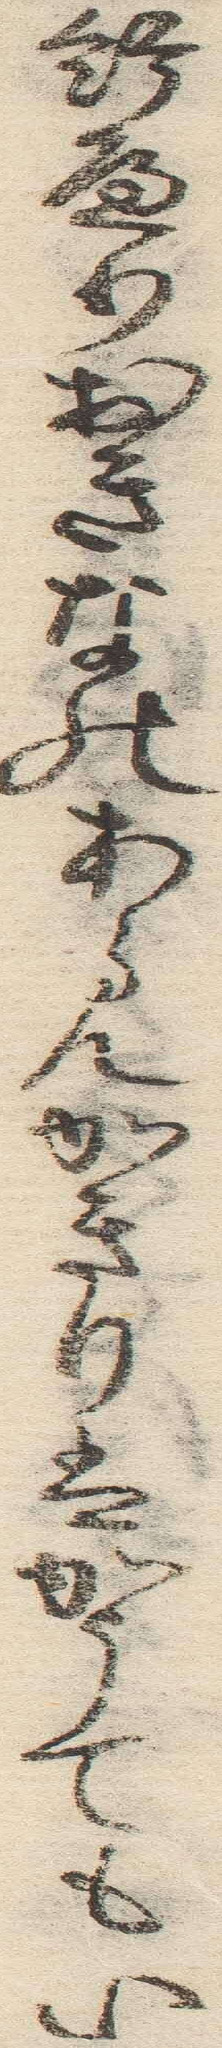給へりおきなのあらんかきりはかうてもい
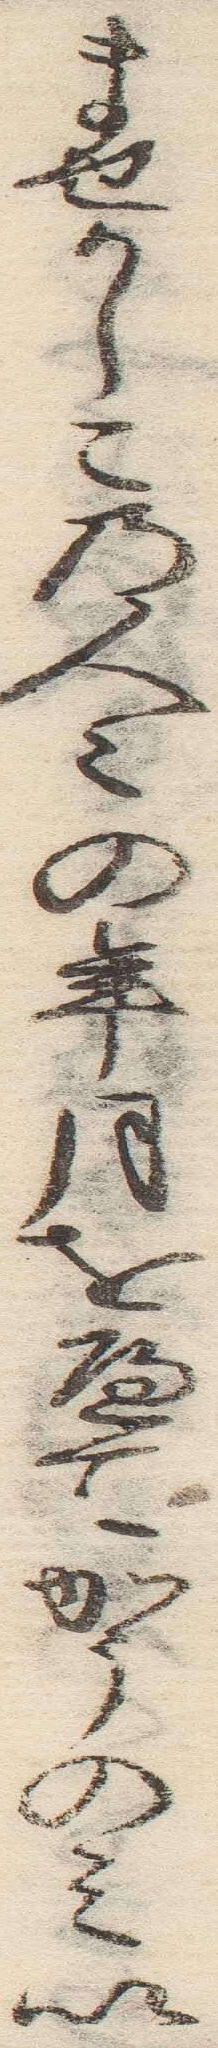ませかしこの人々の年月をへてかうのみい
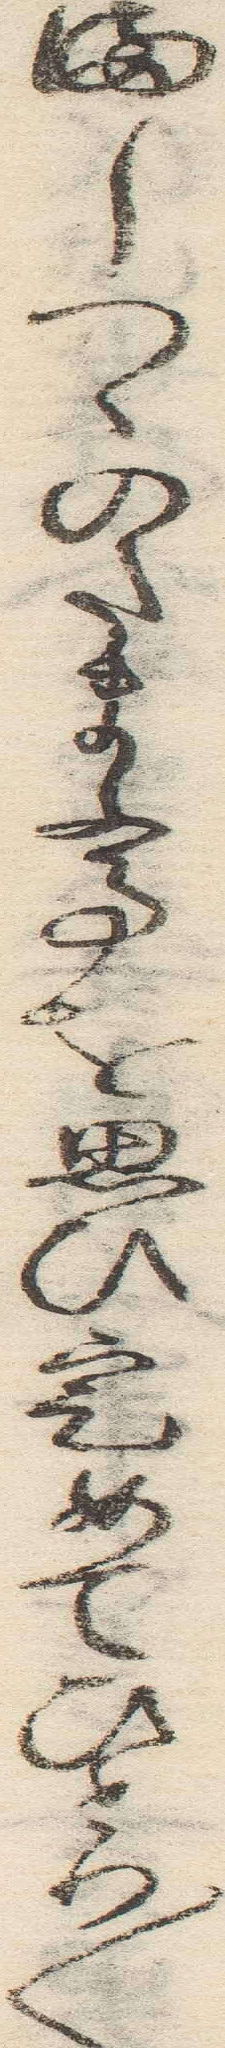ましつゝのたまふ事を思ひ定めてひとり〳〵
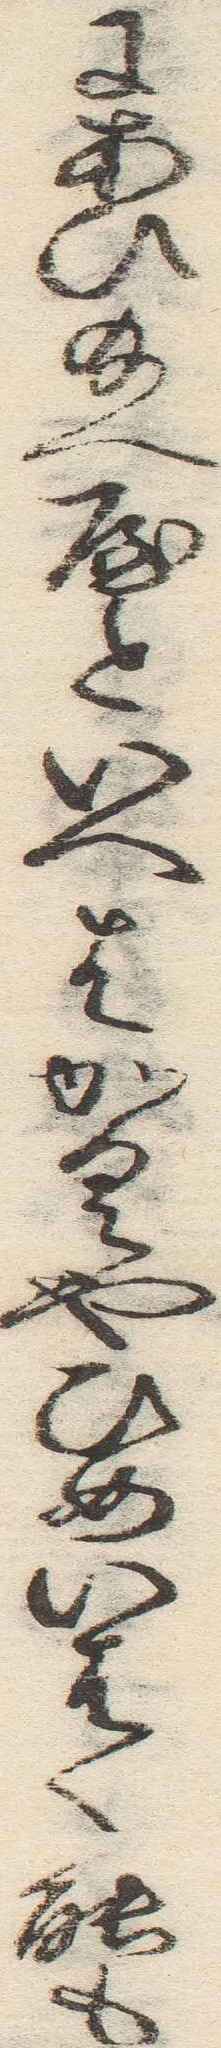にあひ給へやといへはかくやひめいはく能も
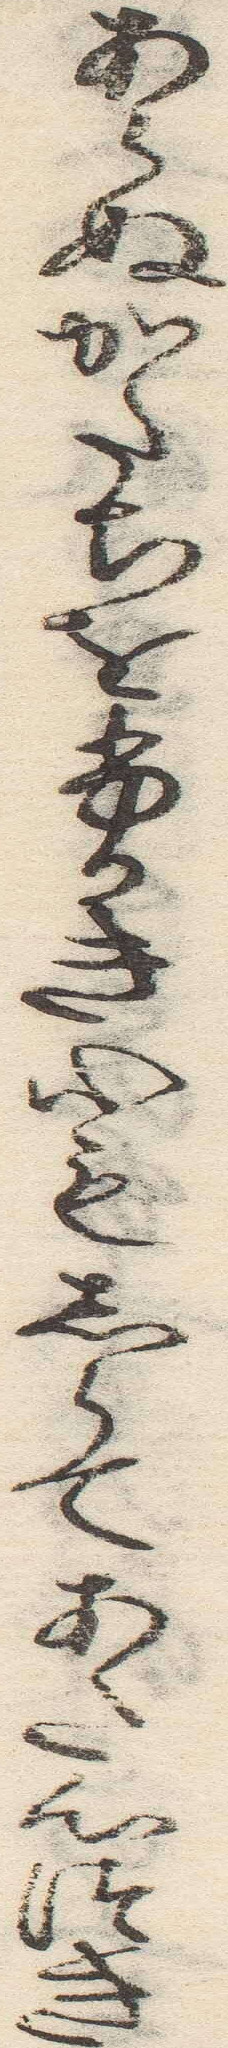あらぬかたちをふかき心もしらてあた心つき
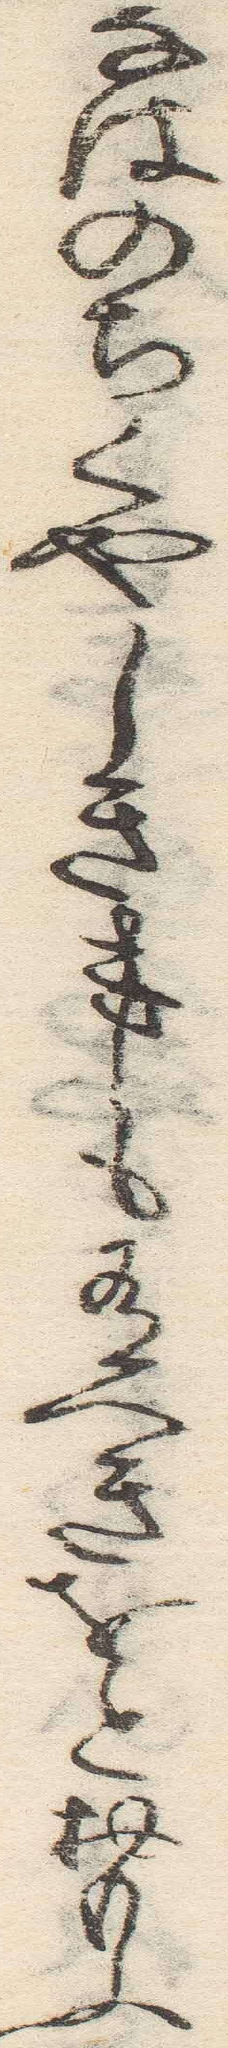なはのちくやしき事も有へきをとおもふ
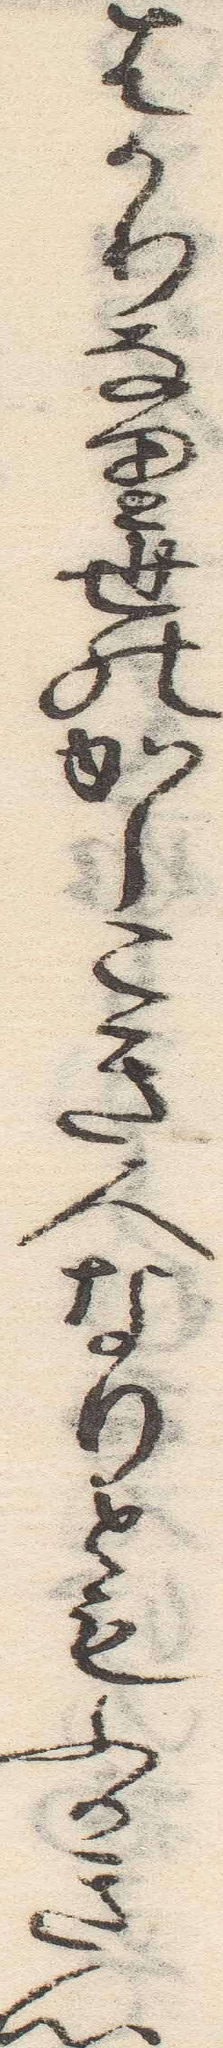はかりなり世のかしこき人なりともふかき心
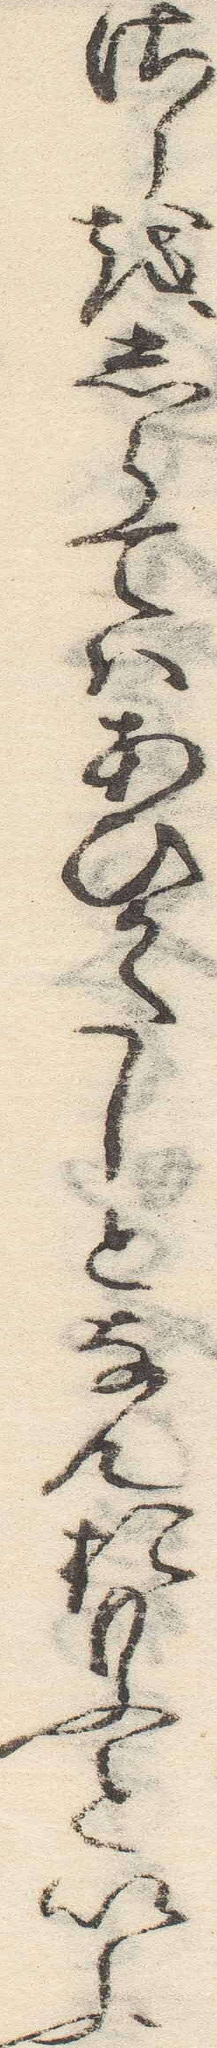さしをしらてはあひかたしとなんおもふといふ
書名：竹取物語
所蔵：東京学芸大学附属図書館 国文学研究資料館
